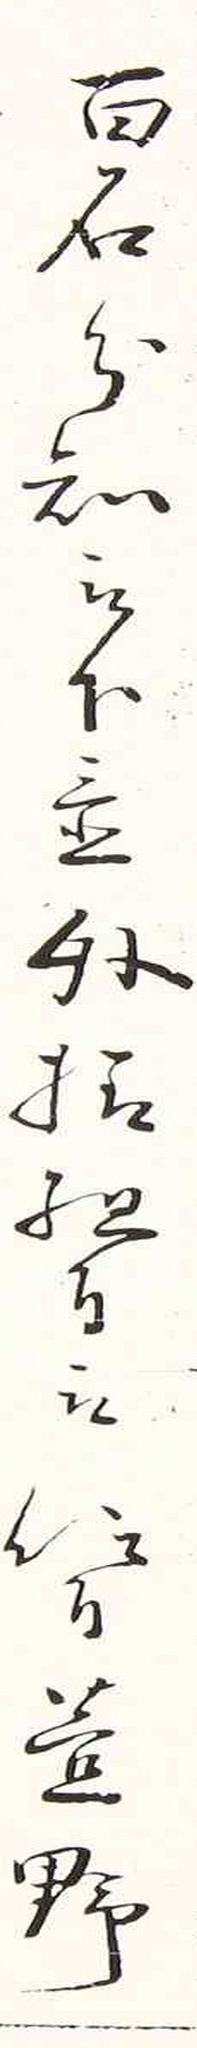百石分知被下置外様組付被仰付萱野
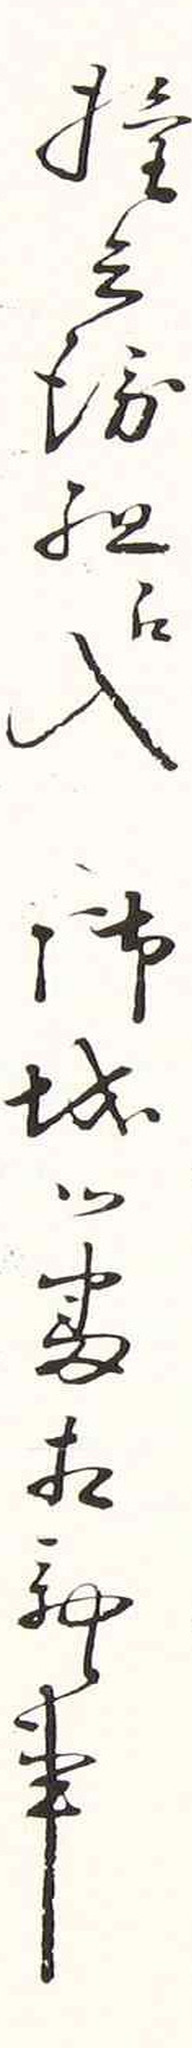権兵衛組江入御城御番相勤候事
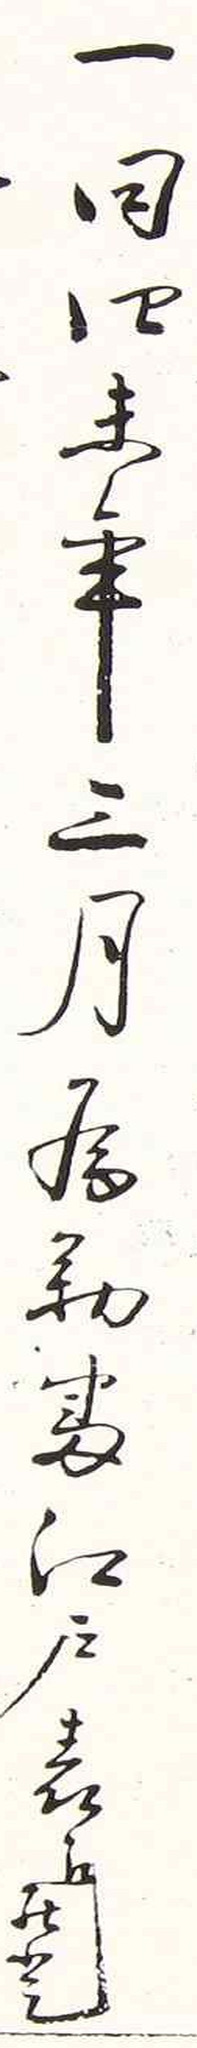一同四未年三月為勤番江戸表江罷登
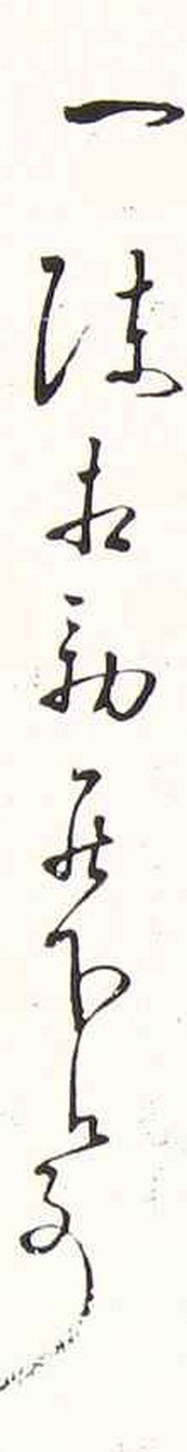一陣相勤罷下候事
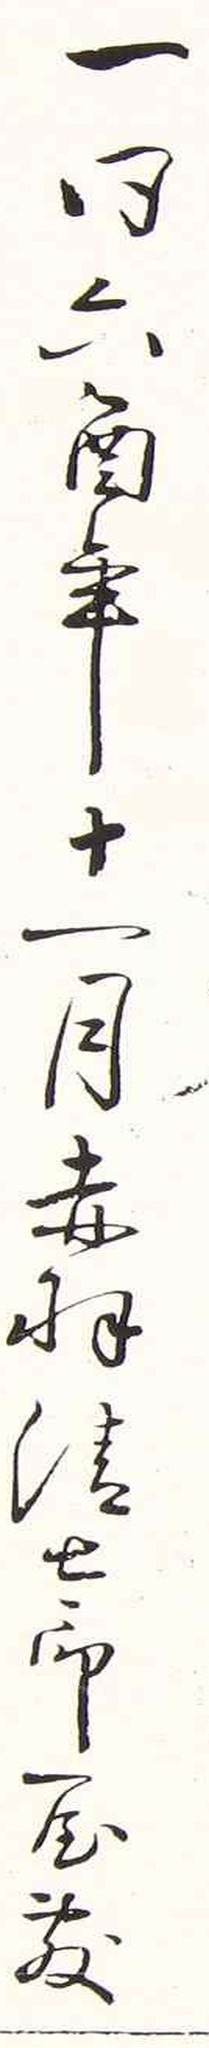一同六酉年十一月赤羽清七郎屋敷
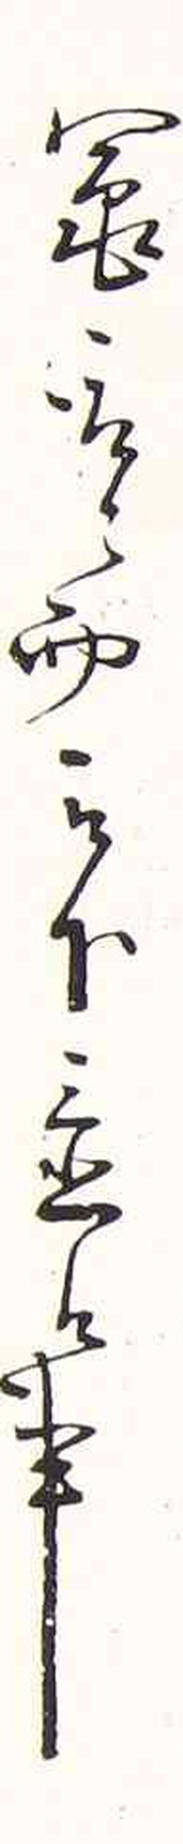䰗取ニ而被下置候事
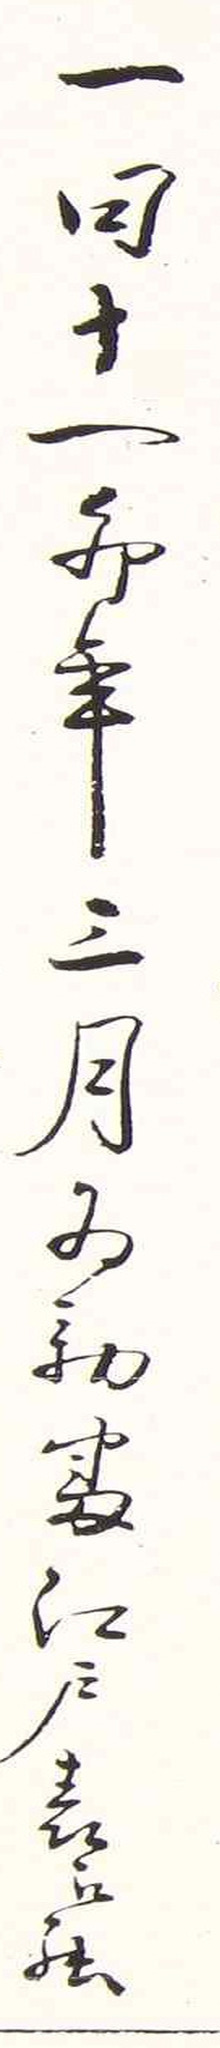一同十一卯年三月為勤番江戸表江罷

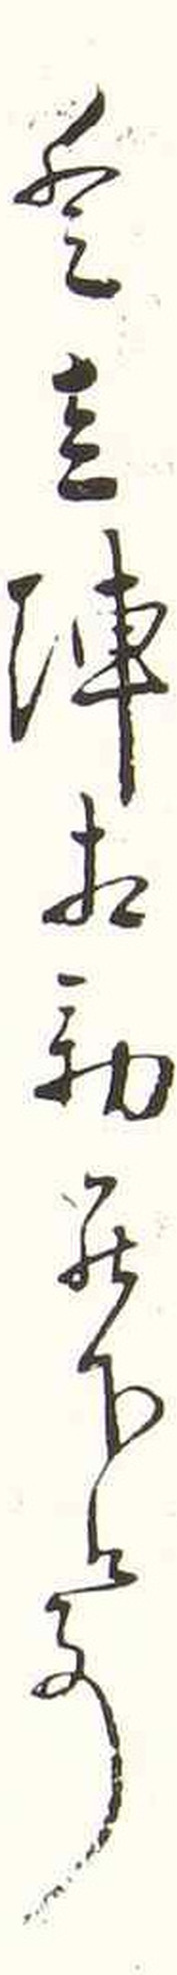登壱陣相勤罷下候事
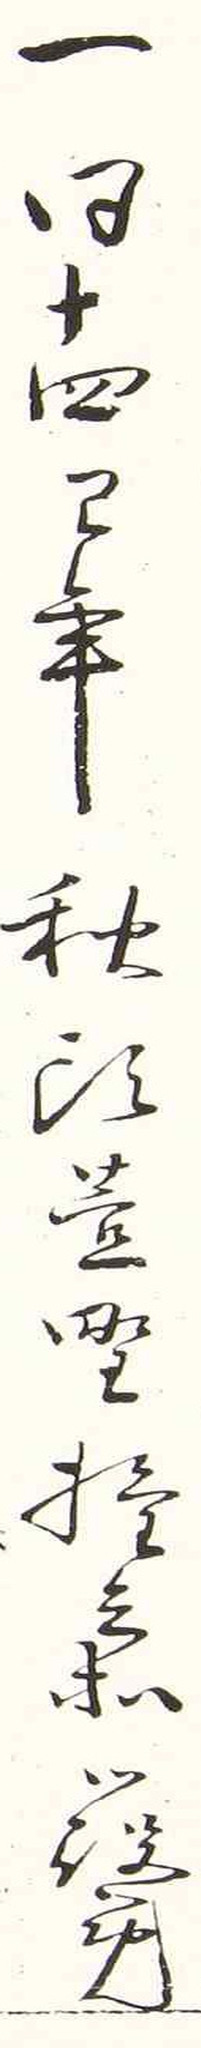一同十四巳年秋頭萱野権兵衛御役御免
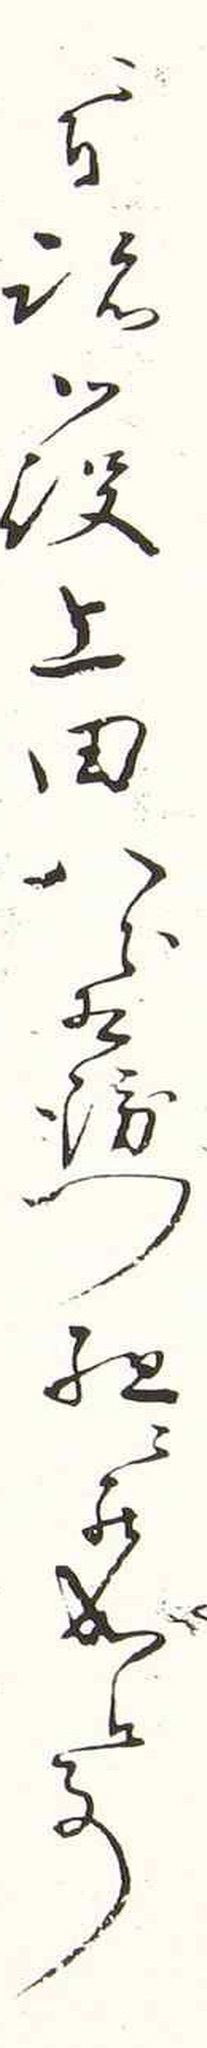ニ付跡御役上田八郎右衛門組ニ罷成候事
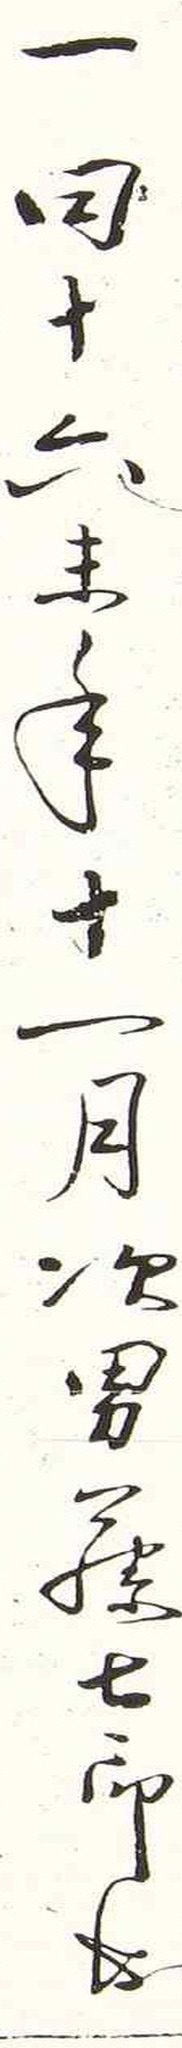一同十六未年十一月次男藤七郎義
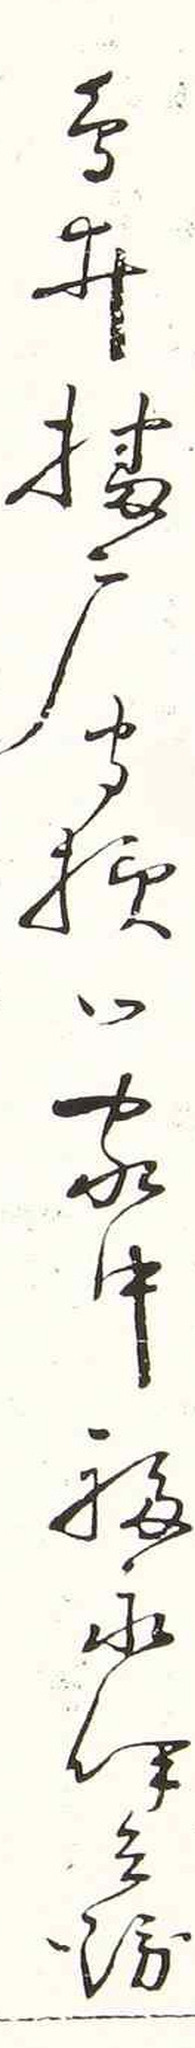鳥井播磨守様御家中福永伊兵衛
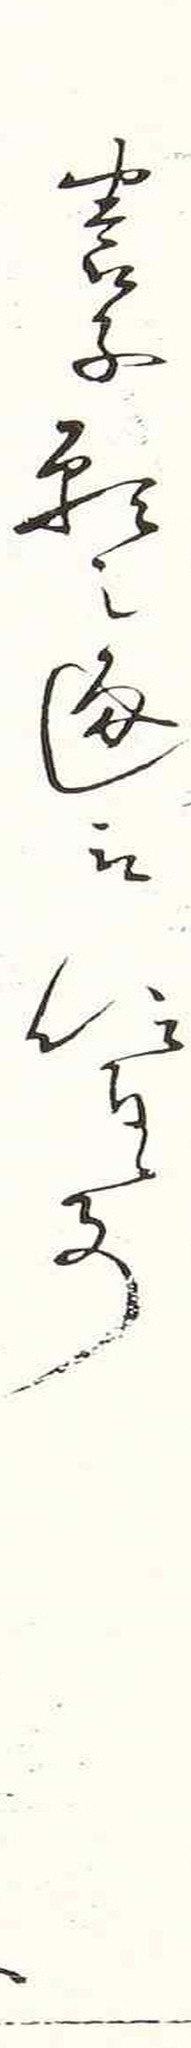養子願之通被仰付候事
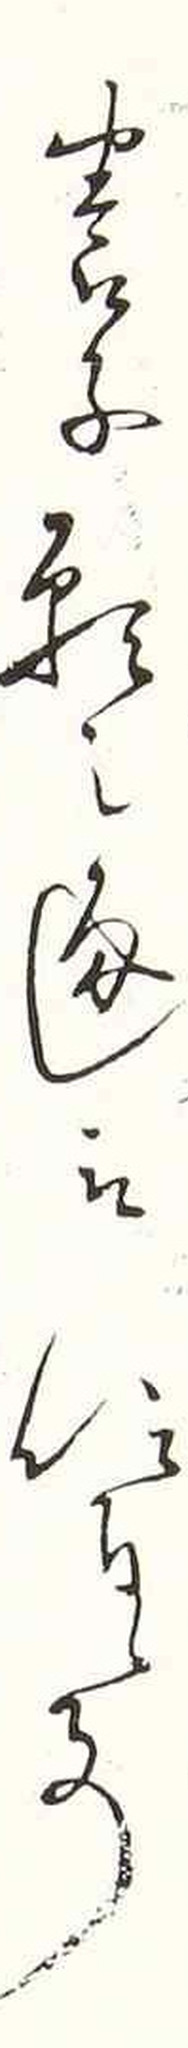養子願之通被仰付候事
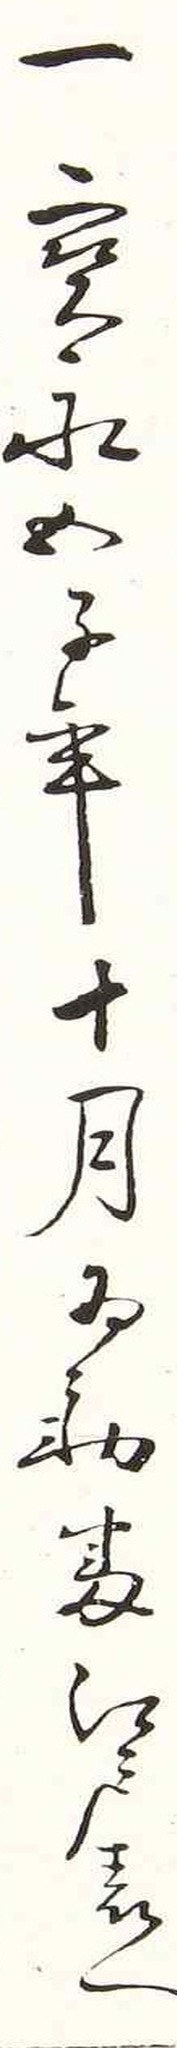一宝永五子年十月為勤番江戸表へ
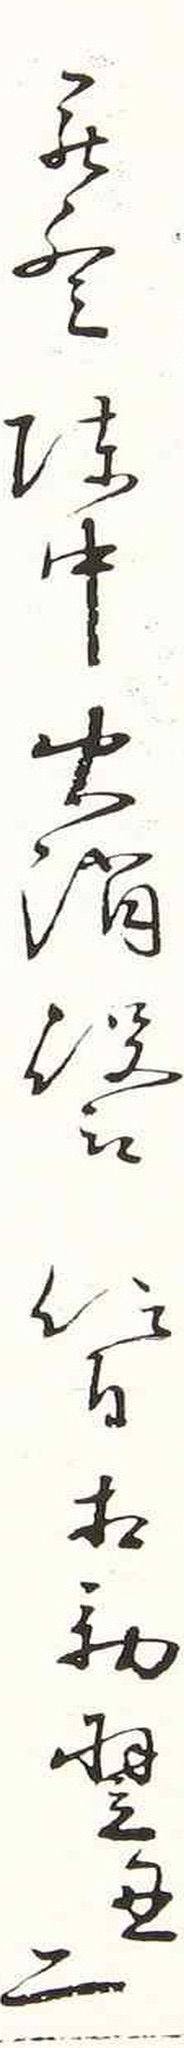罷登陣中火消役被仰付相勤翌三丑二
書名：諸士系譜　巻之357　す之部7
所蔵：会津若松市立会津図書館
